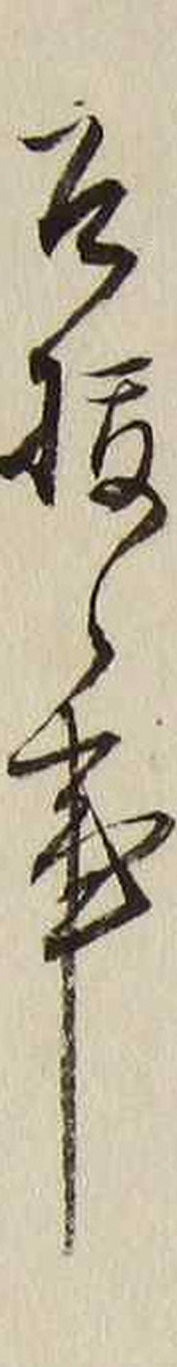召抜候事
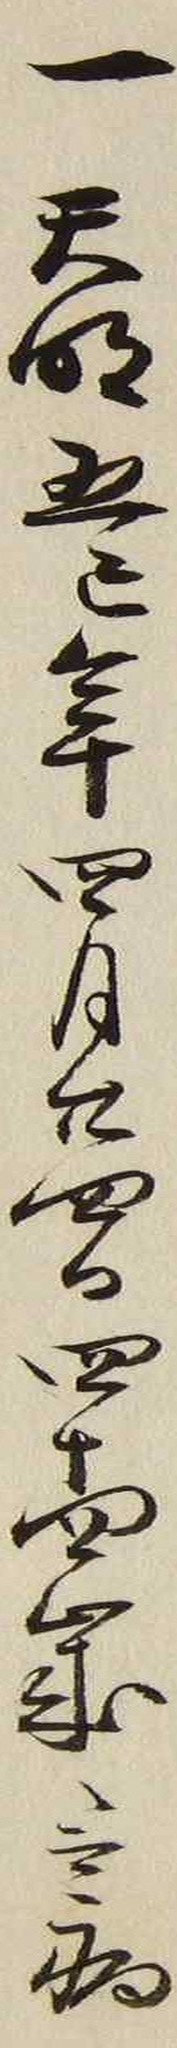一天明五巳年四月廿四日四十四歳ニ而病
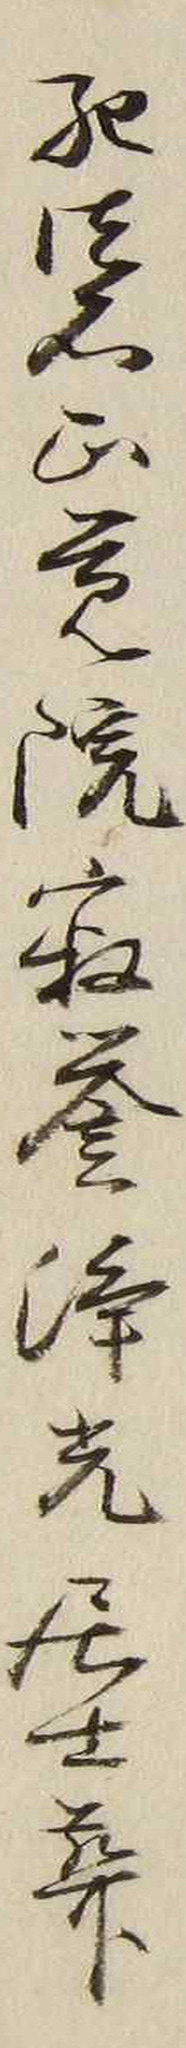死法名正覚院寂誉浄光居士葬

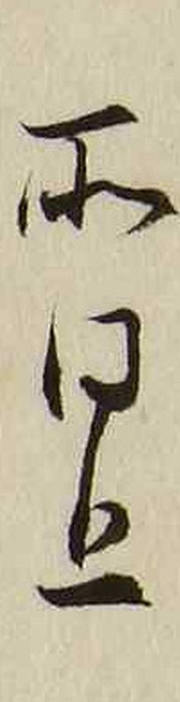所同上
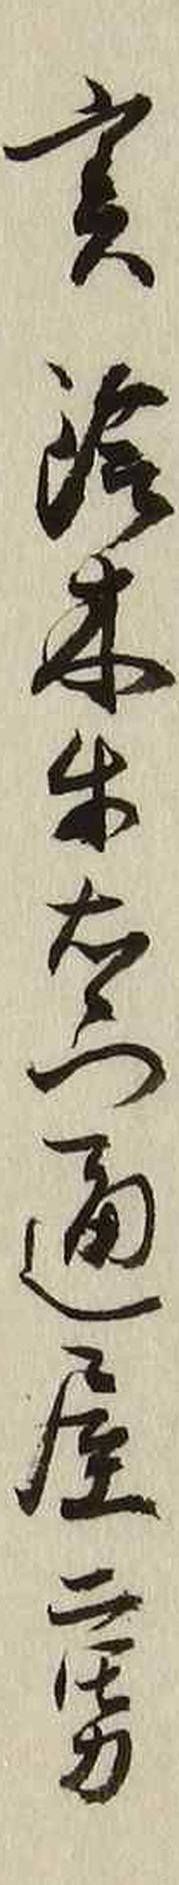実鈴木牛右衛門通屋二男
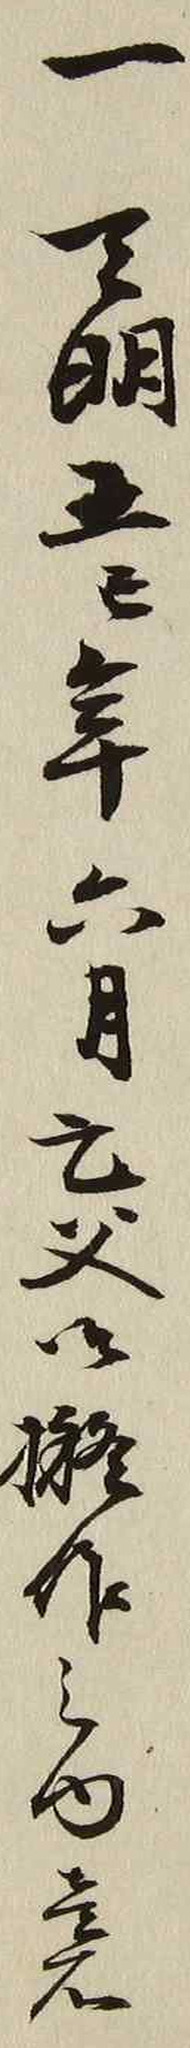一天明五巳年六月亡父御擬作之内壱石
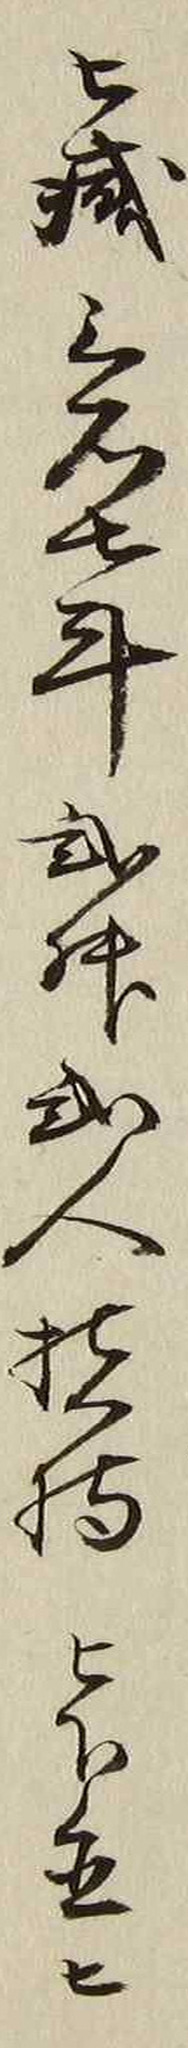被減三石七斗弐升弐人扶持被下置被
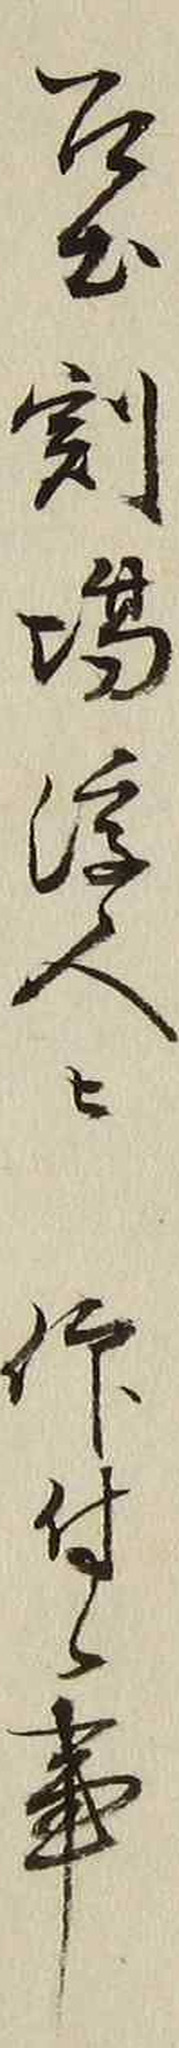召出割場浮人被仰付候事
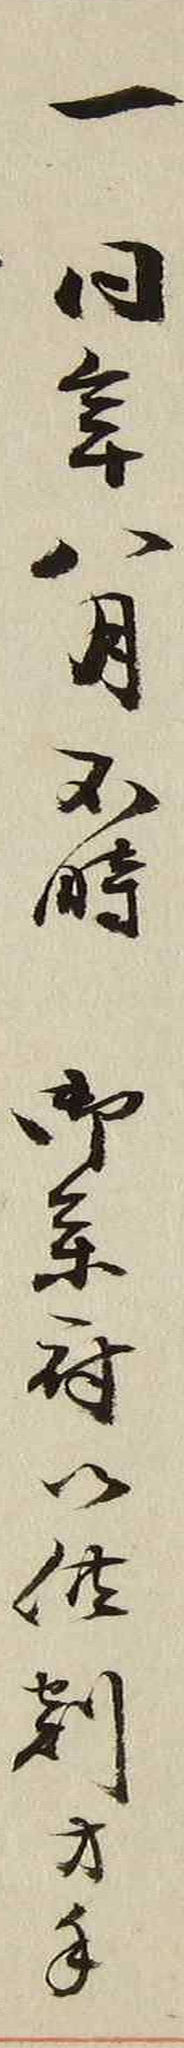一同年八月不時御参府御供刻方手
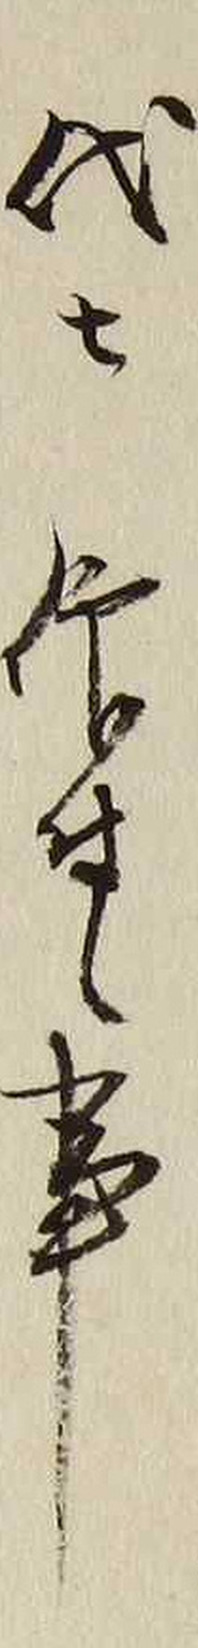代被仰付候事
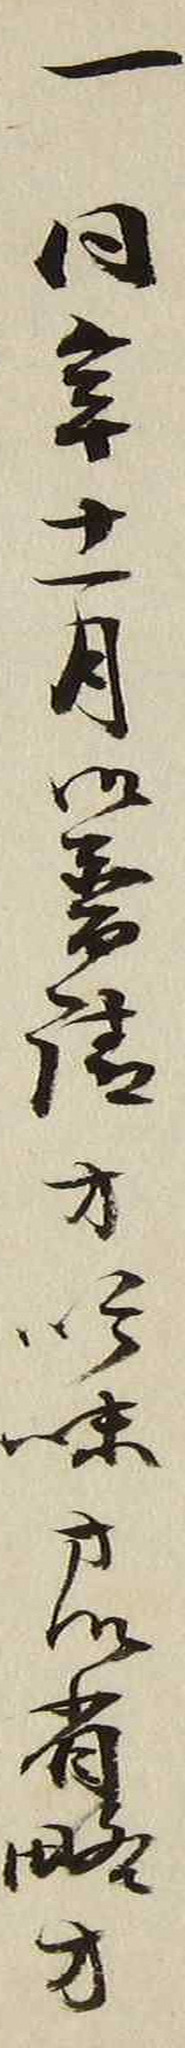一同年十一月御普請方吟方味御省略方
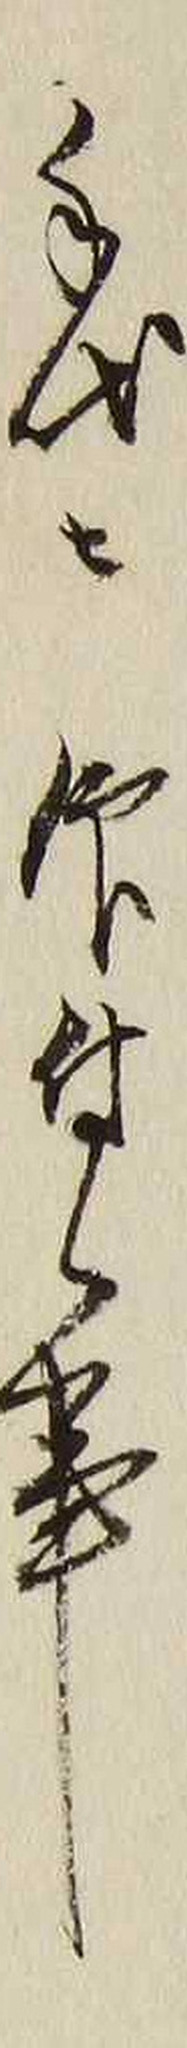手代被仰付候事
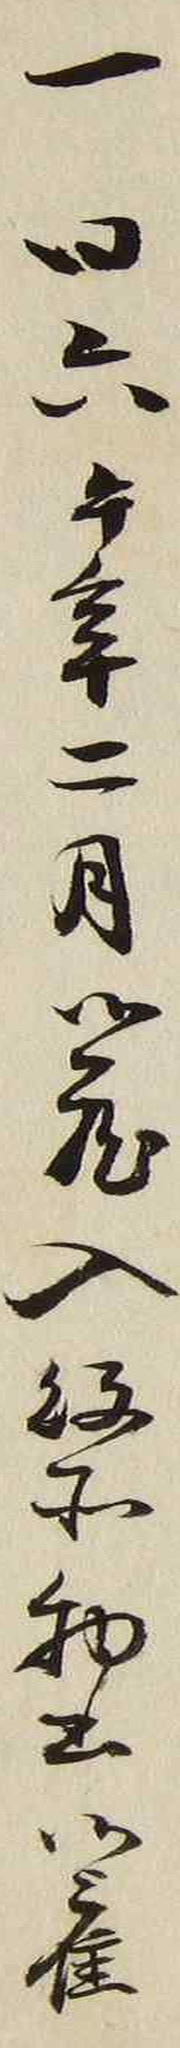一同六午年二月御蔵入役所物書御雇
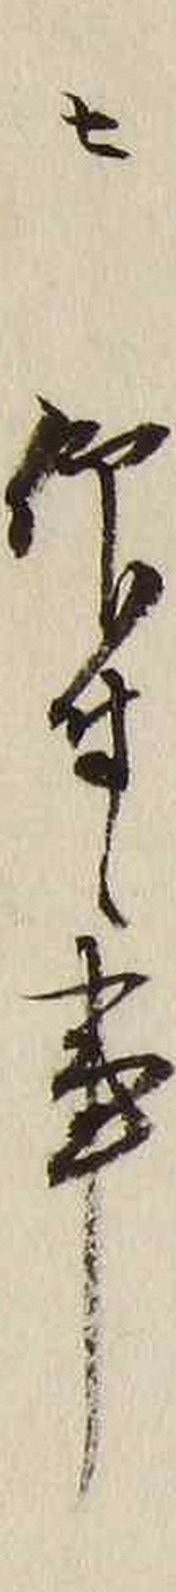被仰付候事

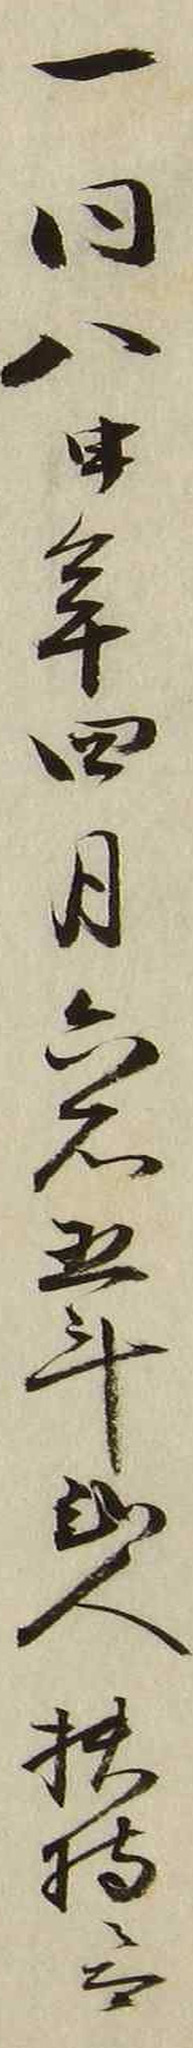一同八申年四月六石五斗弐人扶持ニ而
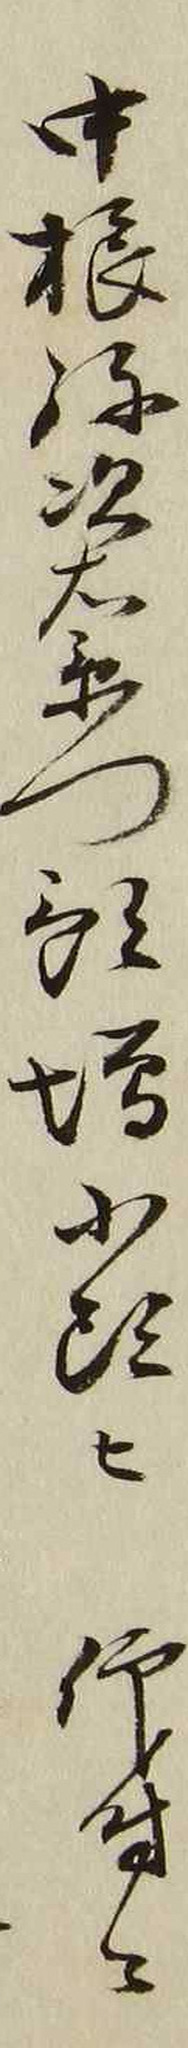中根弥次右衛門預増小頭被仰付候
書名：諸士系譜　巻之291　さ之部23
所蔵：会津若松市立会津図書館
